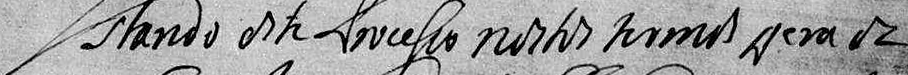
Estando este Processo nestes termos pera oz
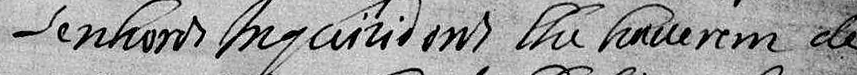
senhores Inquizidores lhe hauerem de
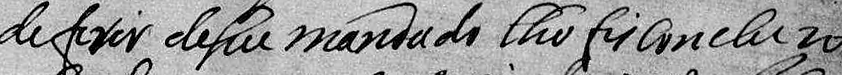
deferir de seu mandado lho foi concluzo
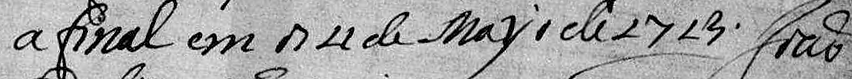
afinal em os 11 de Mayo de 1713. Joaõ
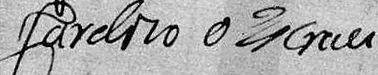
Cardozo o Escreui
